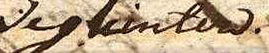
seguintes.
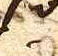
1.o
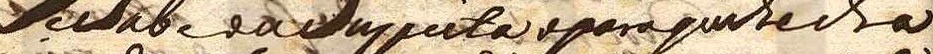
Se Sabe ou Suspeita o para que he cha
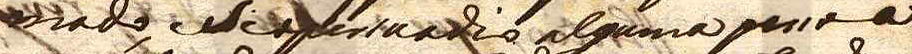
mado, e se o persuadio alguma pessoa
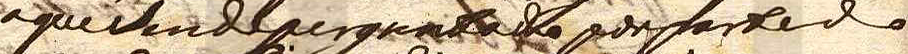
a que sendo perguntado por parte do
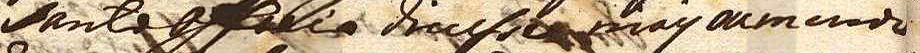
santo officio dicesse mais ou menos
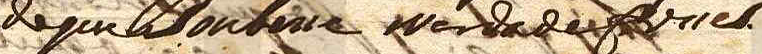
do que soubesse e verdade fosse.
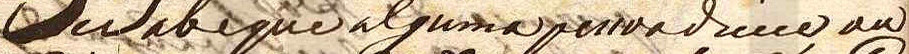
Se Sabe que alguma pessoa diceçe, ou
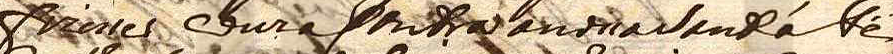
fizesse couza Contra a nossa Santa Fé
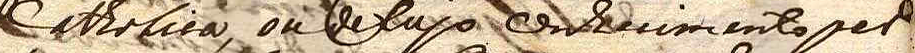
Catholica, ou de Cujo conhecimento per
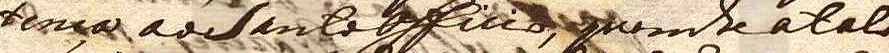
tença ao Santo officio, quem he a tal
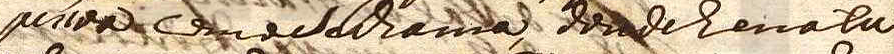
pessoa como Se chama, donde he natu
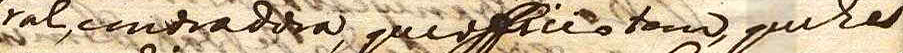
ral, e moradora, que officio tem, que he
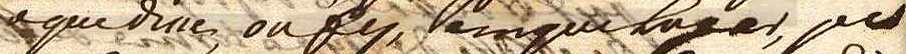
o que disse, ou fes, em que Lugar, pe
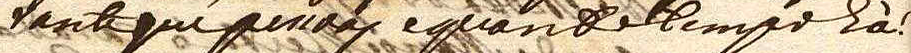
rante que pessoas e quanto tempo há
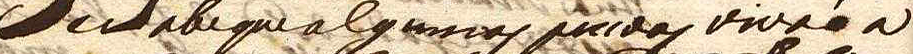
Se Sabe que algumas pessoas vivaõ a
